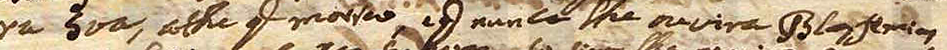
ra boa, athe q̄ morreo, e q̄ nunca lhe ouvira Blasfemias,
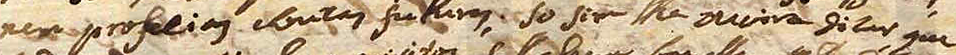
nem profecias e couzas futuras, so sim lhe ouvira dizer que
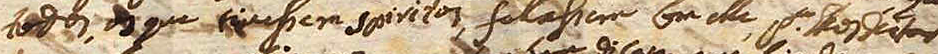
todos, os que tivessem spiritos, falassem com elle p.a lhos deitar
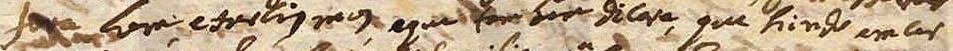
fora com exorcismos, que tambem dicera, que hindo em cer
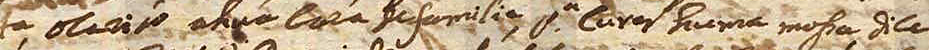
ta, ocasiaõ a huā caza De familia, p.a curar huma mossa, dice
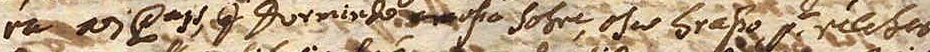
ra aos pais, q̄ Dormindo a mossa sobre, o seu brasso, p.a receber
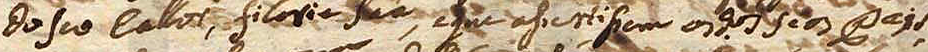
do seo callor, ficaria saã, e que assentissem os d.os seos pais
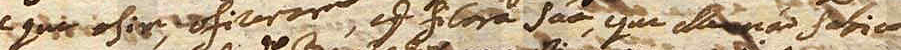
e que asim, o fizeram, e q̄ ficara saã e que elle não sabia
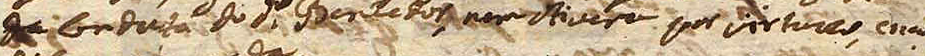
da conduta do d.o Benzedor, nem o tivera por virtuozo, e naõ
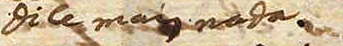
dice mais nada.
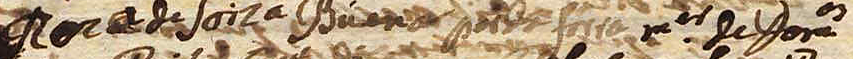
Roza de Soiza Búeno parda forra m.er de Dom.os
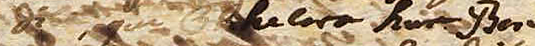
di que Conhecera hum Ben
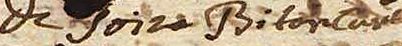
de Soiza Bitencurt
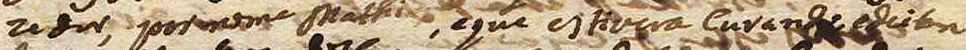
zedor, por nome Mathias, e que estivera curando e deitan
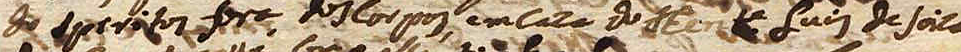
do spiritos fora, dos corpos em caza do thent.e Luis de Soiza
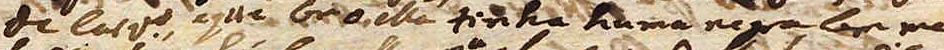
de Carv.o, e que como ella tinha huma negra com ma
